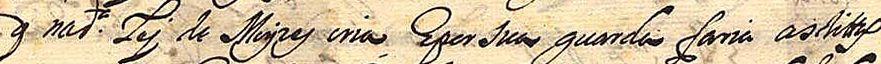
q̄ na d̄a. Lej de Moyzes cria, E por sua guarda faria as dittas
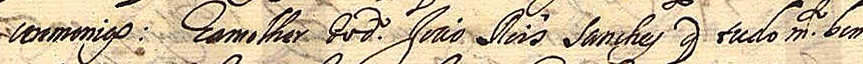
ceremonias: E a molher do d̄o. Joaõ Roīs Sanches q̄ tudo m.to bem
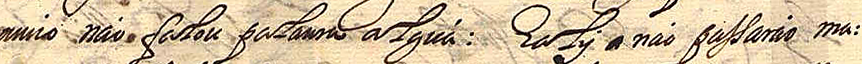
ouuio naõ falou palaura aLguā: E aLy a naõ passaraõ ma
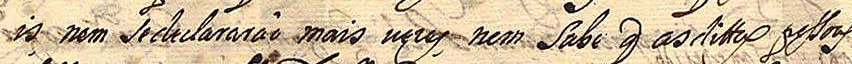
is, nem se declararaõ mais uezes, nem Sabe q̄ as dittas pessoas
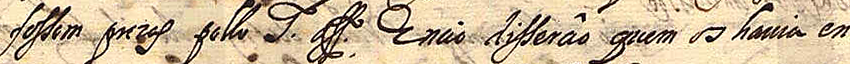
fossem prezas pello S.to off.o, E naõ disseraõ quem os hauia en
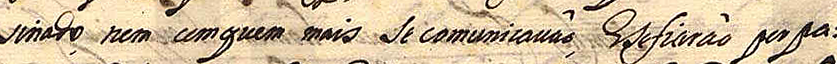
sinado, nem com quem mais se comunicauaõ, E se fiaraõ por pa
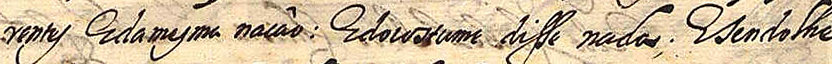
rentes E da mesma nacaõ: E do costume disse nada; E sendolhe
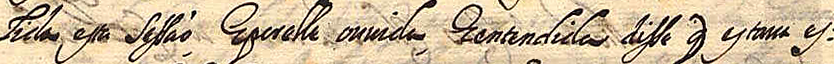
Lida esta Sessaõ, E por elle ouuida, E entendida disse q̄ estaua es
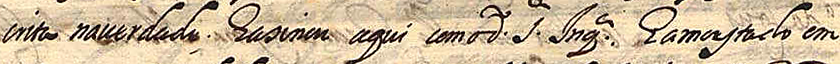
crita na uerdade; E asinou aqui com o d̄o. sor. Inqor. E amoestado em
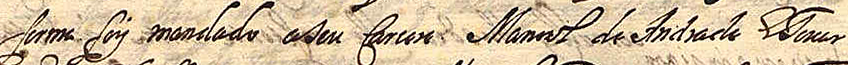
forma foy mandado a seu Carcere. Manoel de Andrade E Touar
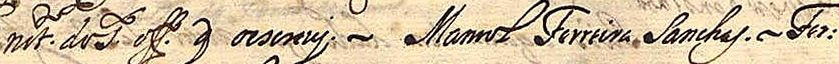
notto. do s.to off.o q̄ o escreuj. ~ Manoel Ferreira Sanches. ~ Fer
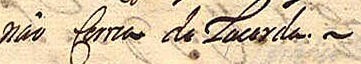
naõ Correa de Lacerda. ~
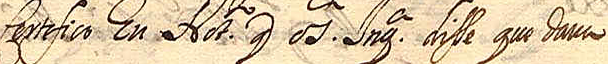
Certefico Eu Not.to q̄ o sor. Inqor. disse que daua
